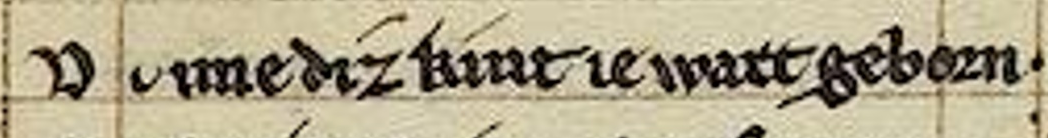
D(az) ime diz kint ie wart geborn.
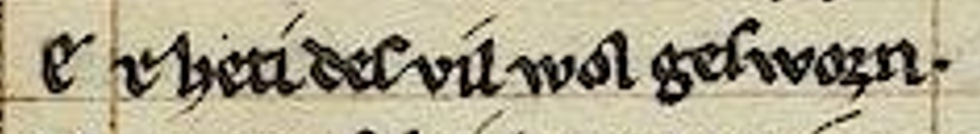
Er heti deſ vil wol geſworn.
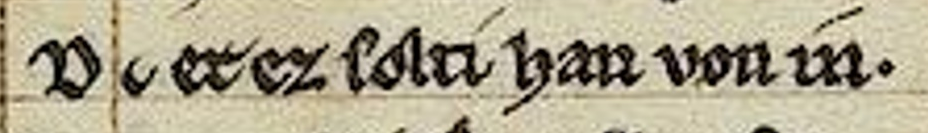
D(az) er ez ſolti han von in.
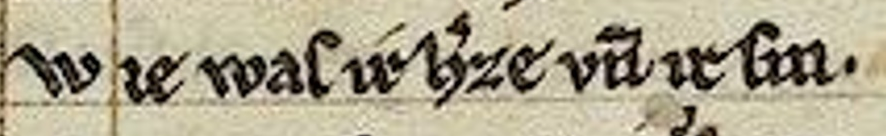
Wie waſ ir h(er)ze vn(d) ir ſin.
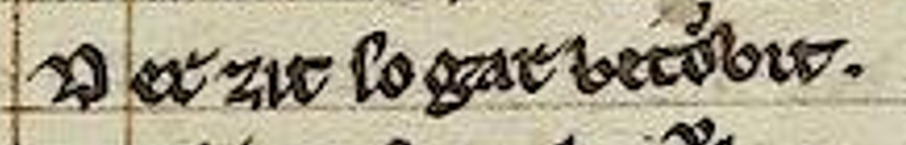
Der zit ſo gar beto°vbit.
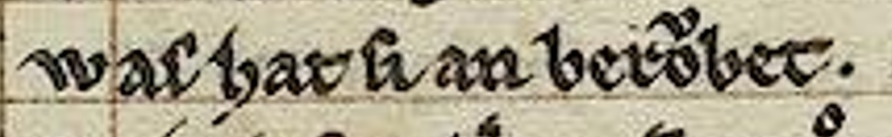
Waſ hat ſi an bero°vbet.
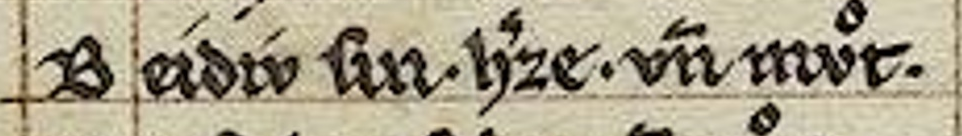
Beidiv ſin. h(er)ze. vn(d) mv°ot.
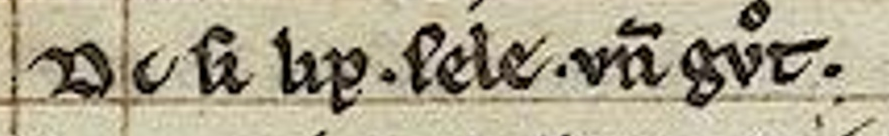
D(az) ſi lip. ſele. vn(d) gv°ot.
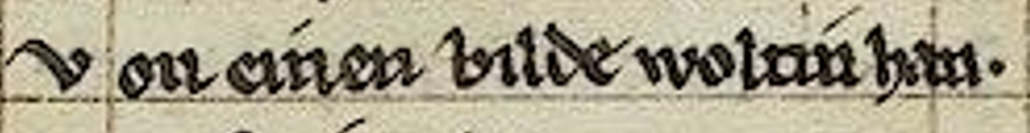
Von einen bilde woltin han.
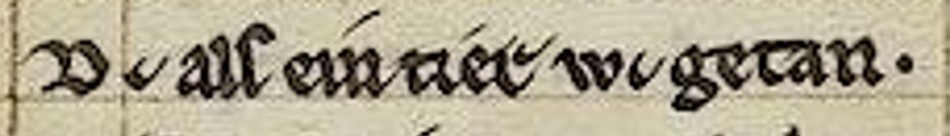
D(az) alſ ein tier w(az) getan.
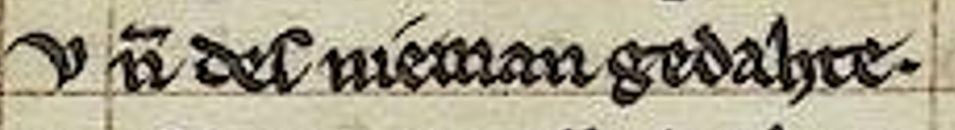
Vn(d) deſ nieman gedahte.
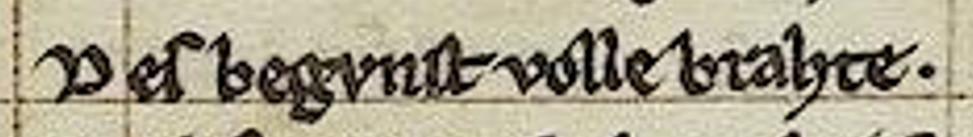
Deſ begvnſt volle brahte.
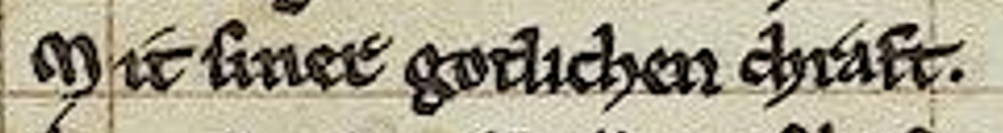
Mit ſiner gotlichen chraft.
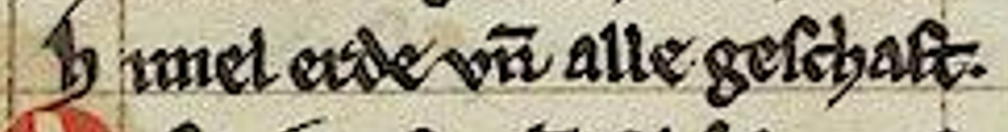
Himel erde vn(d) alle geſchaft.
